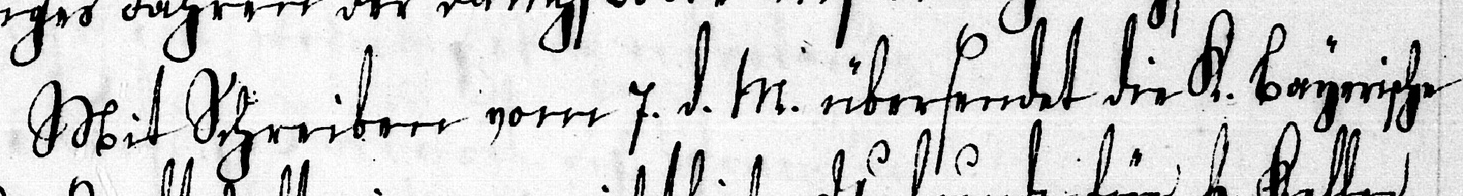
Mit Schreiben vom 7. d. M. übersendet die K. Bayerische
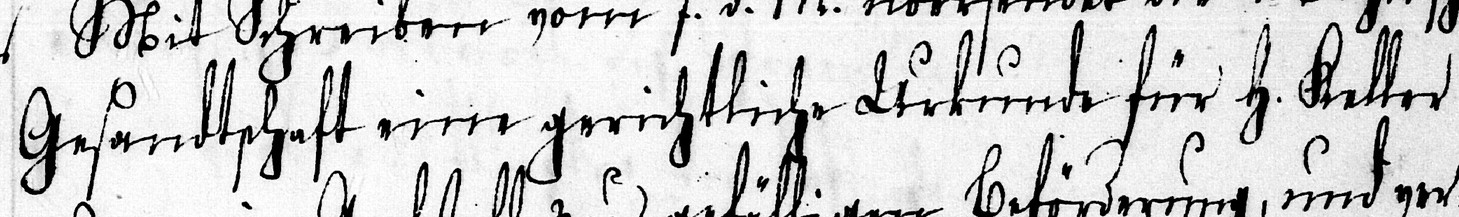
Gesandtschaft eine gerichtliche Urkunde für H. Keller
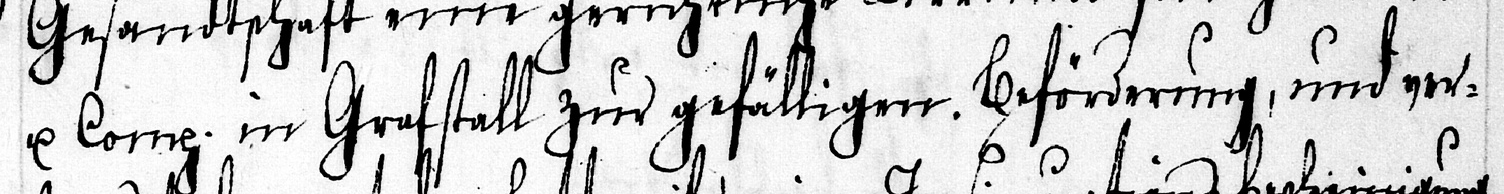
u. Comp. in Grafstall zur gefälligen Beförderung, und ver¬
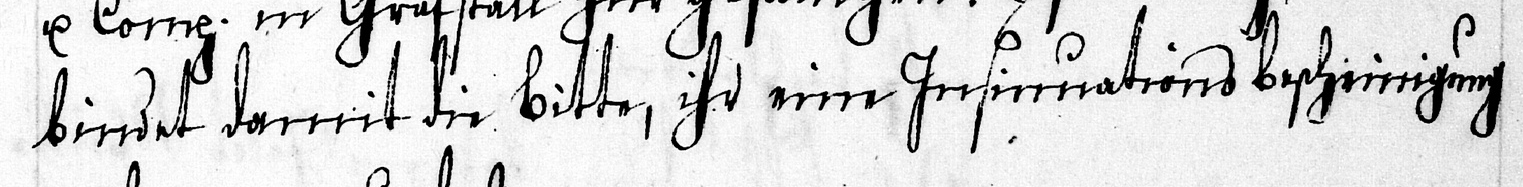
bindet damit die Bitte, ihr eine Insinuationsbescheinigung
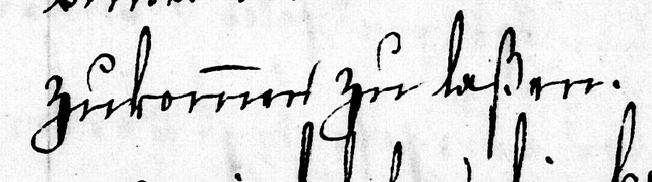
zukommen zu laßen.
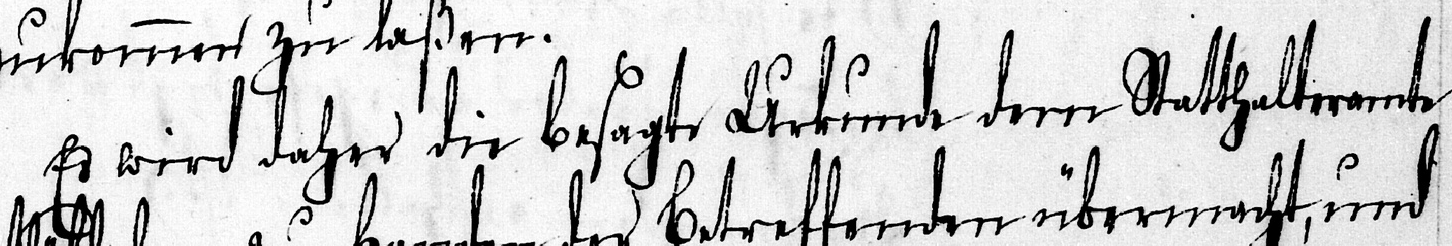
Es wird daher die besagte Urkunde dem Statthaltera¬
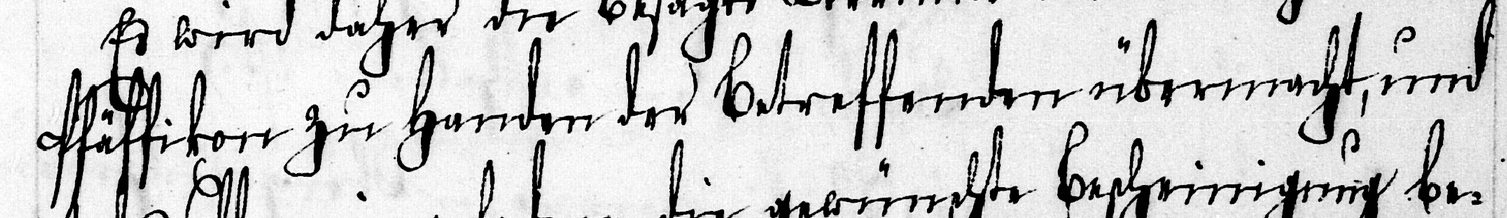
Pfäffikon zu Handen der Betreffenden übermacht, und
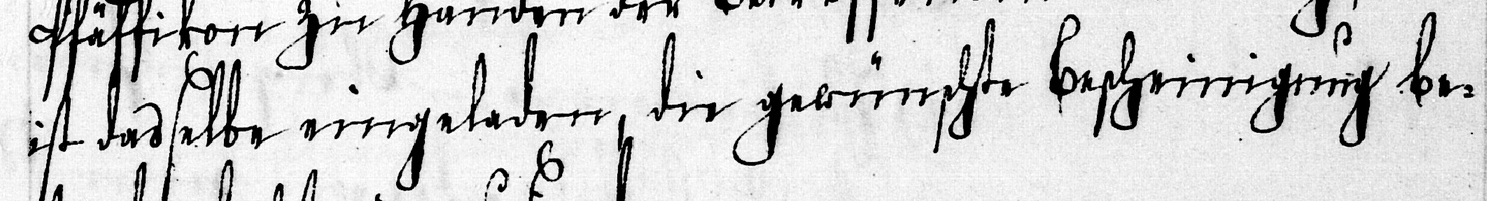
st dasselbe eingeladen, die gewünschte Bescheinigung be¬
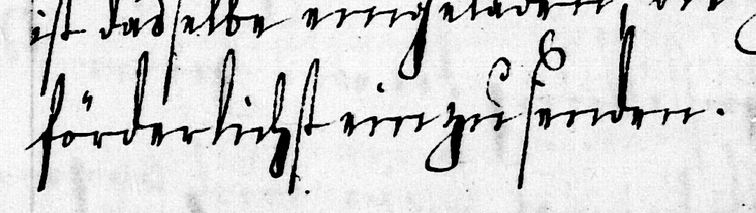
förderlichst einzusenden.
